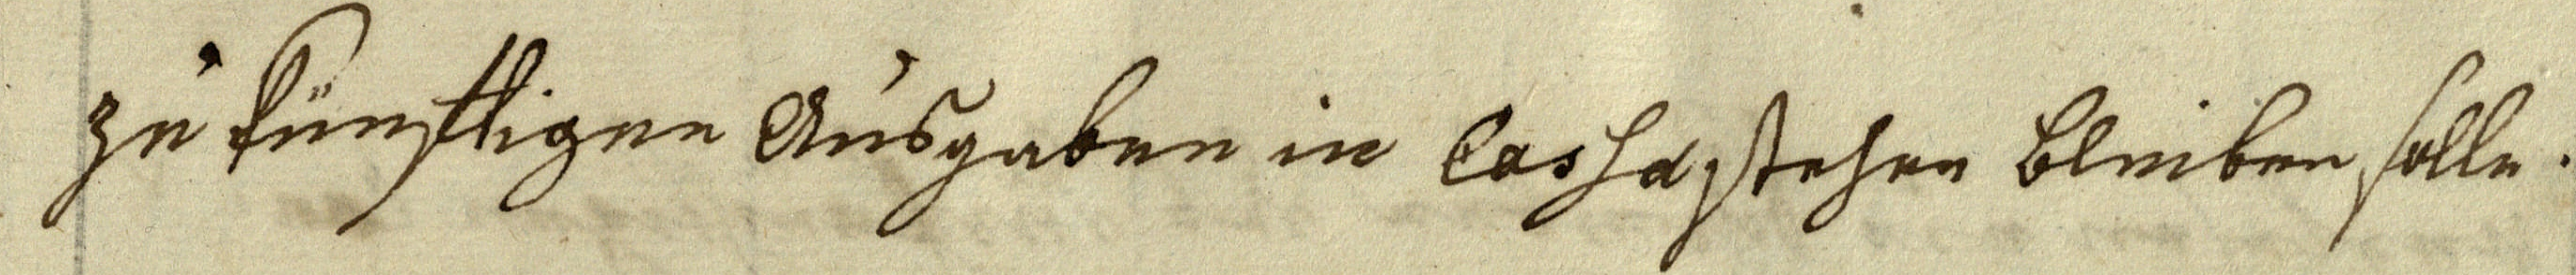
zukünftigen Ausgaben in cassa stehen bleiben solle.
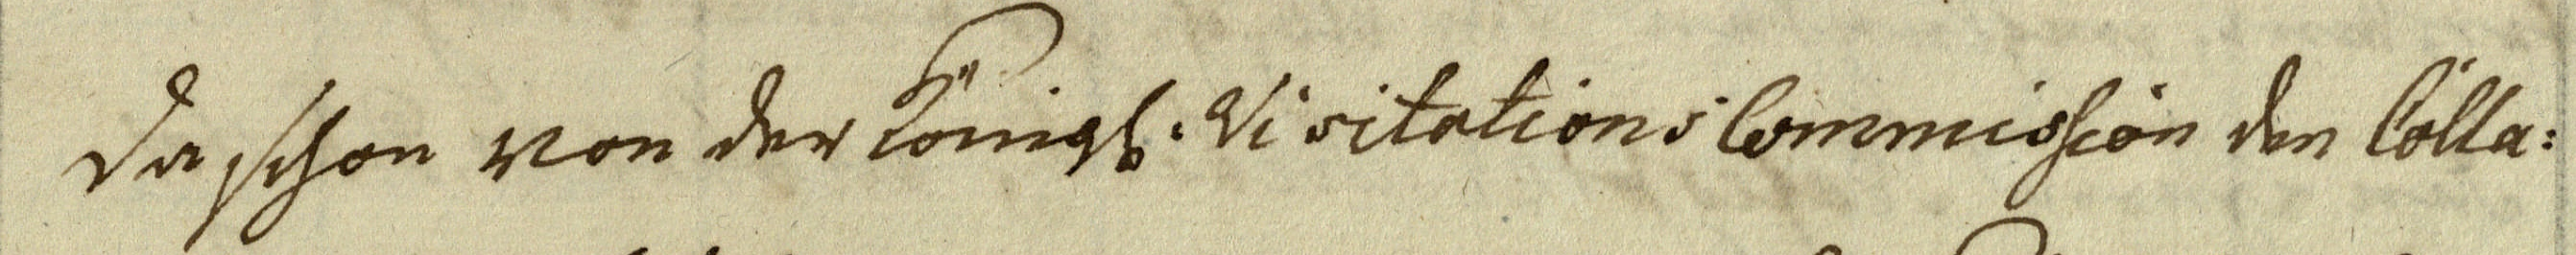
da schon von der Königl. Visitations Commission den Colla¬
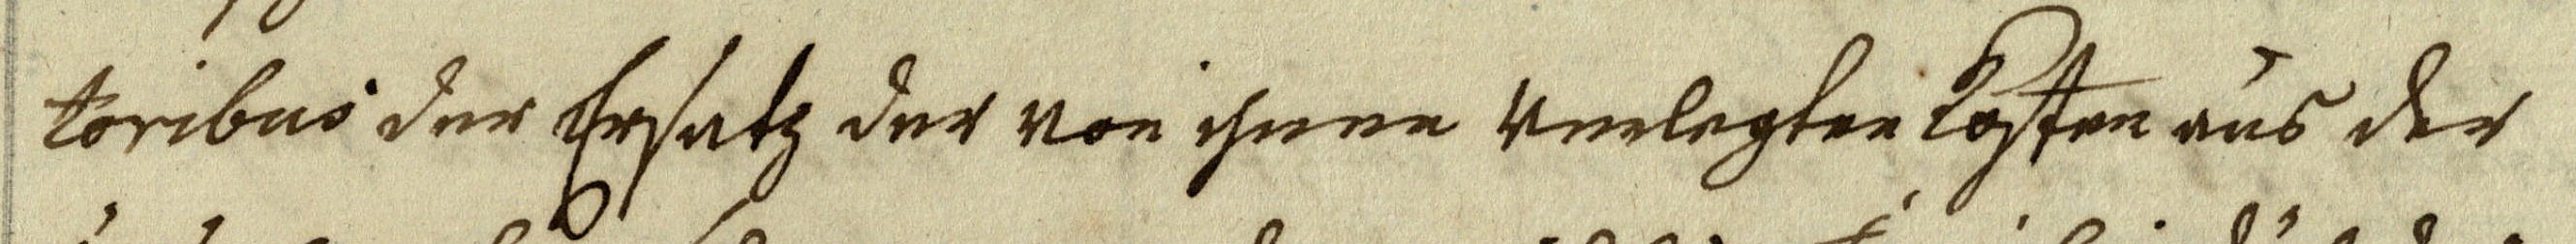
toribus der Ersatz der von ihnen verlegten Kosten aus der
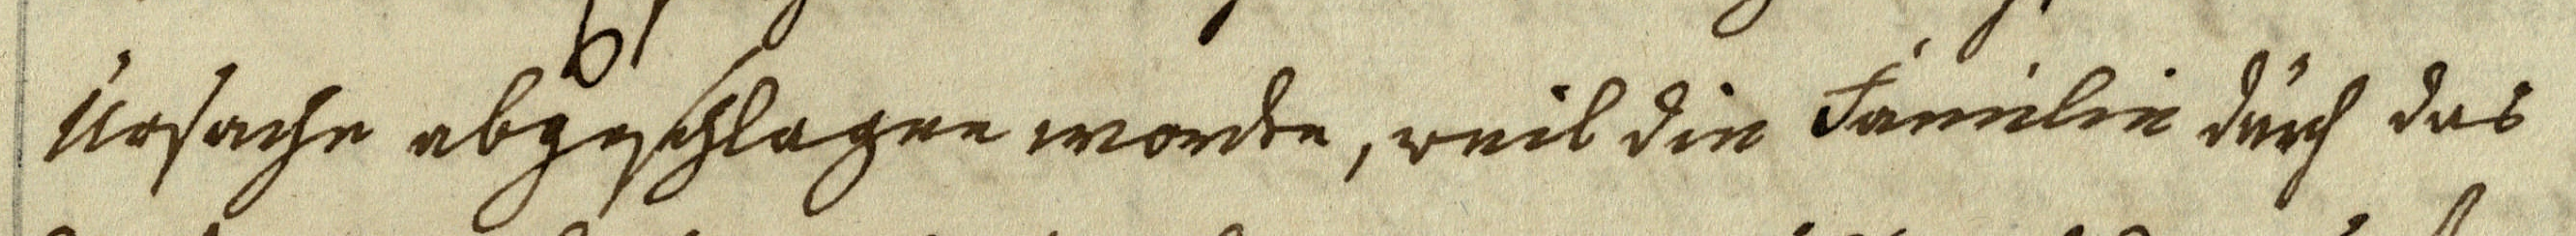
Ursache abgeschlagen worden, weil die Familie durch das
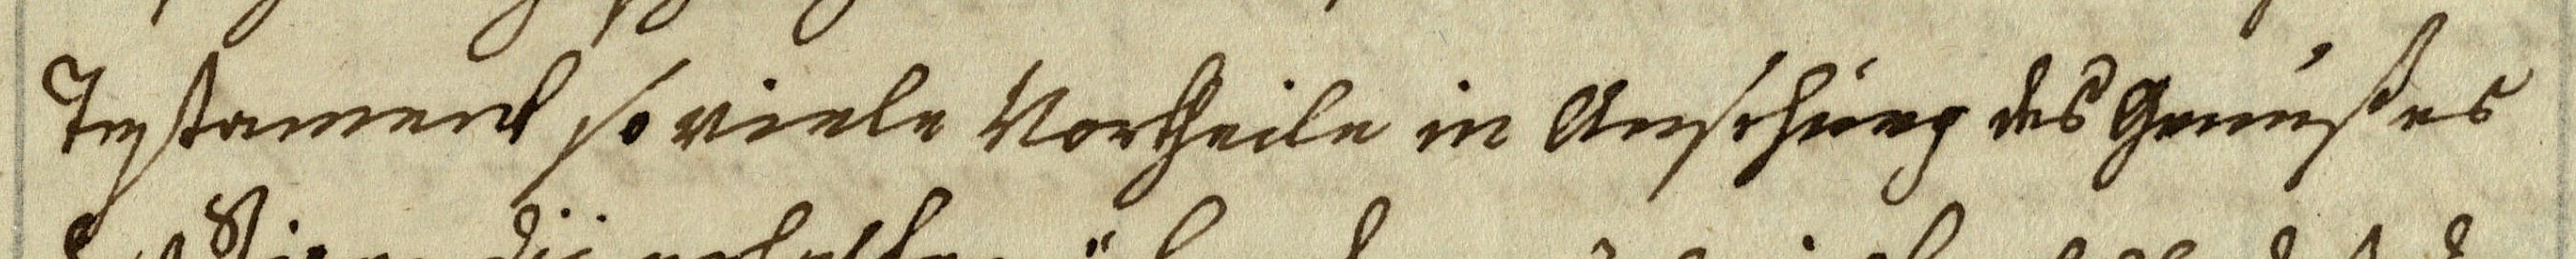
Testament so viele Vortheile in Ansehung des Genußes
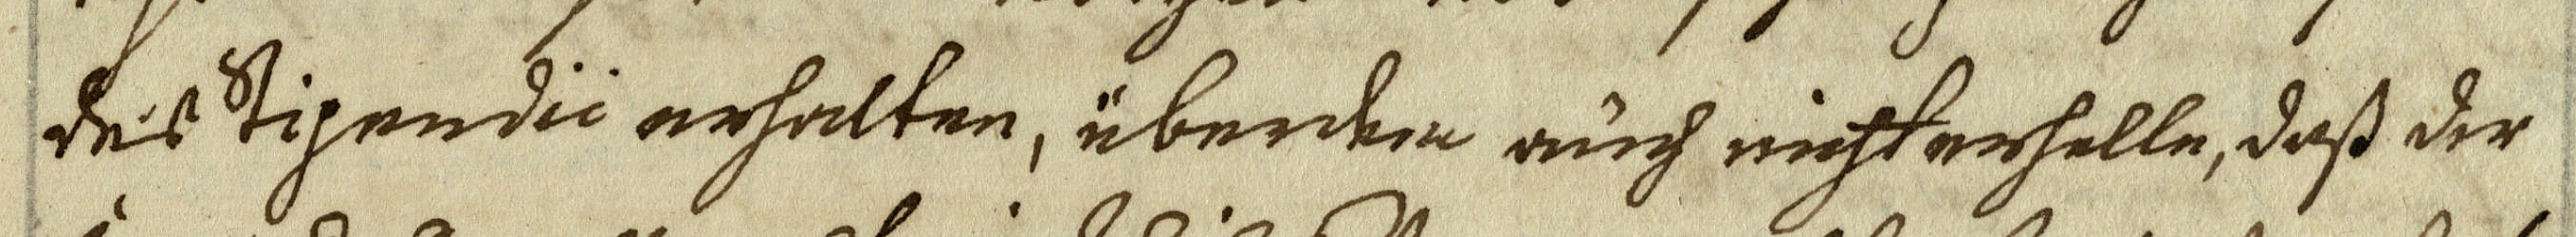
des Stipendii erhalten, überdem auch nicht erhelle, daß der
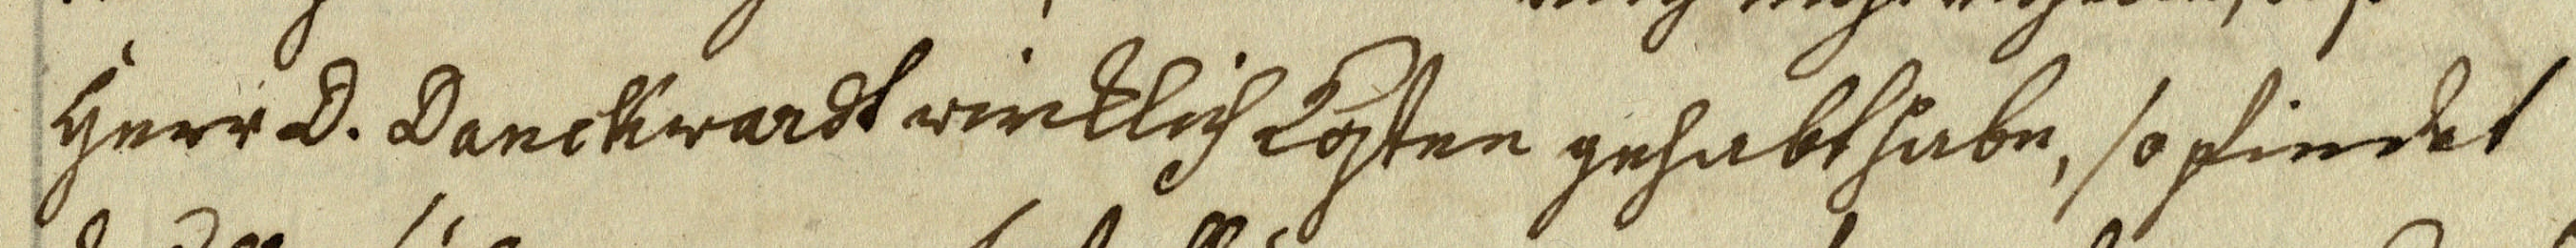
Herr D. Danckwardt wirklich Kosten gehabt habe, so findet
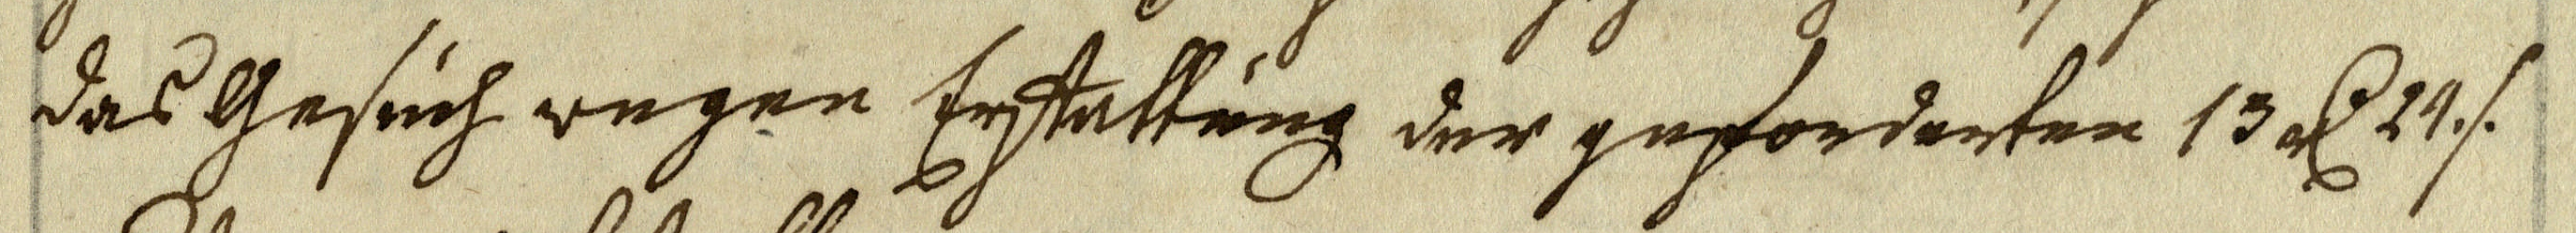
das Gesuch wegen Erstattung der geforderten 13 r. 21. s.
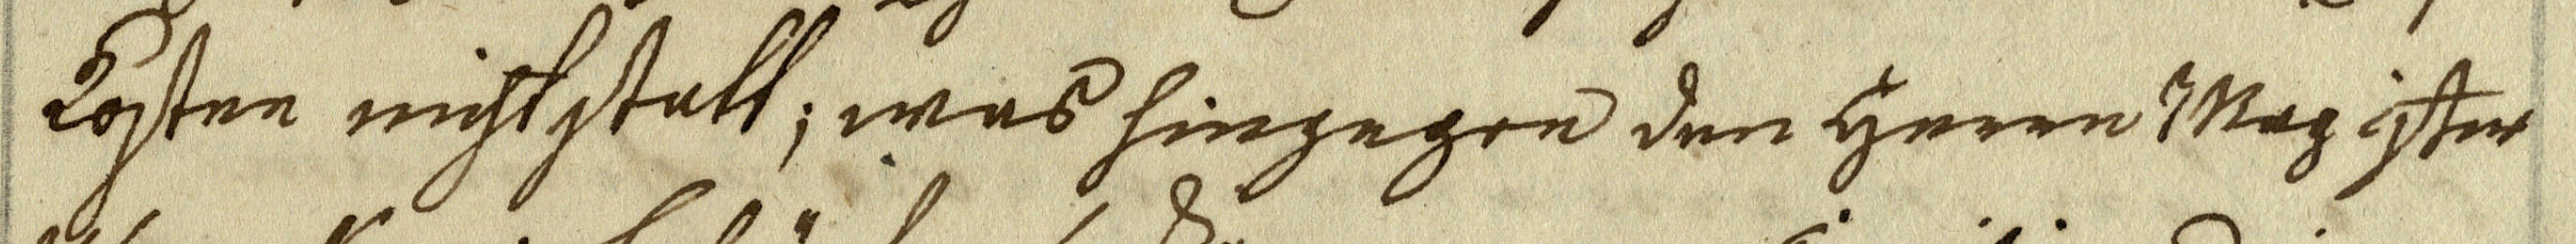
Kosten nicht statt; was hingegen den Herrn Magister
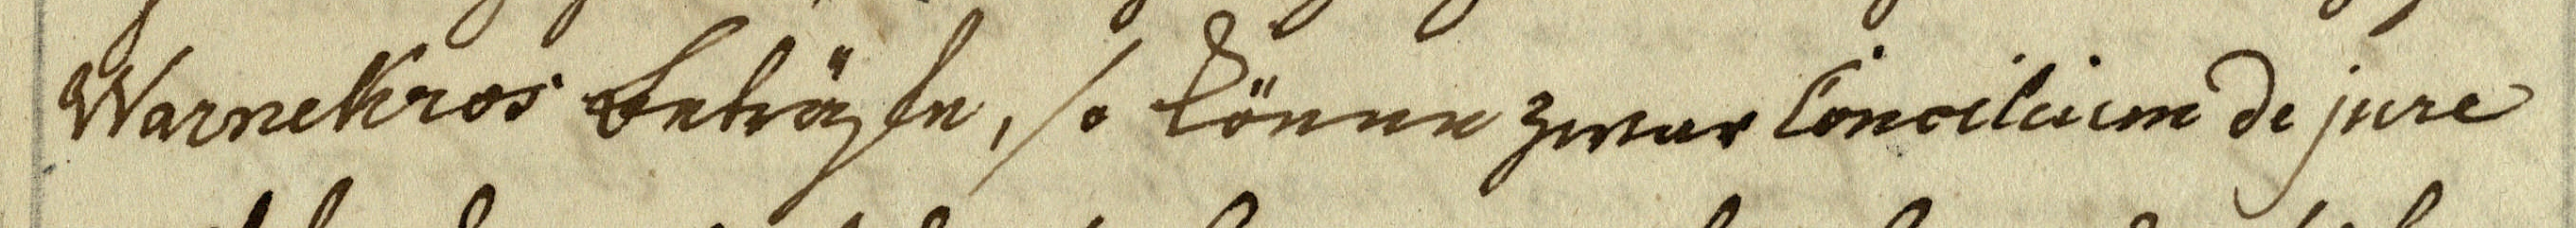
Warnekros beträfe, so könne zwar Concilium de jure
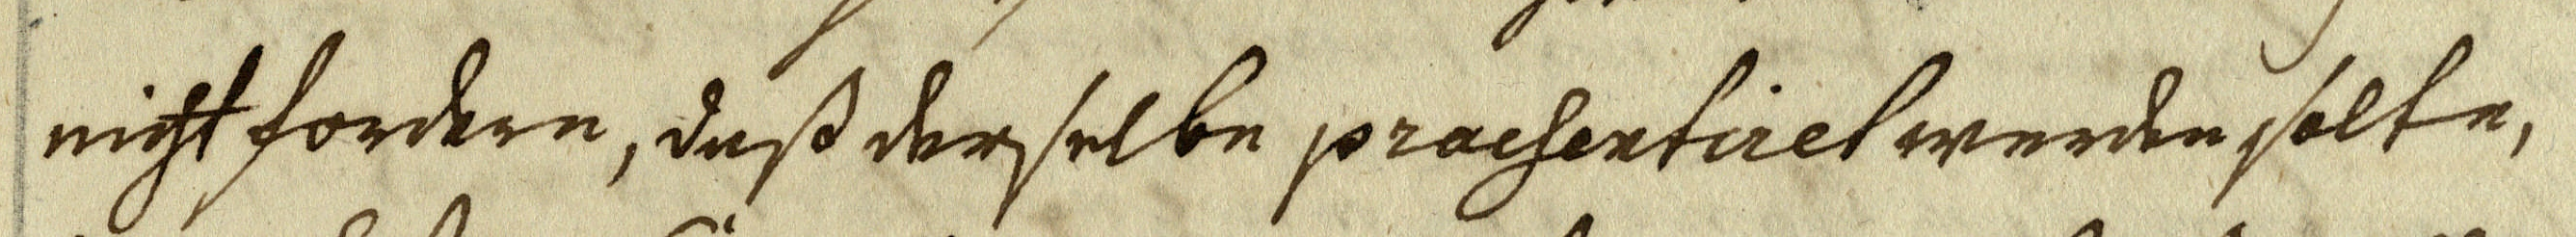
nicht fordern, daß derselbe praesentiret werden solte,
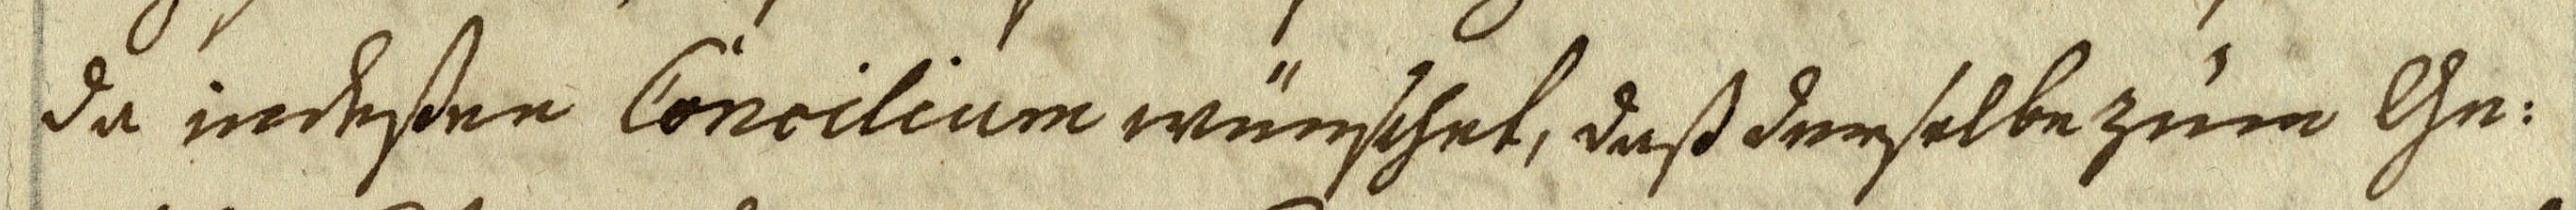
da indeßen Concilium wünschet, daß derselbe zum Ge¬
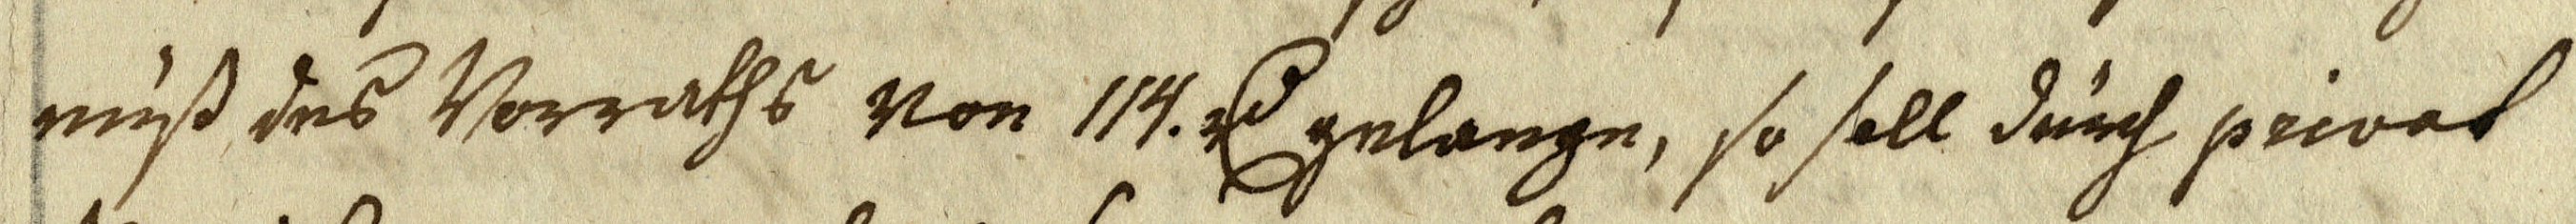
nuß des Vorraths von 114. r. gelange, so soll durch privat
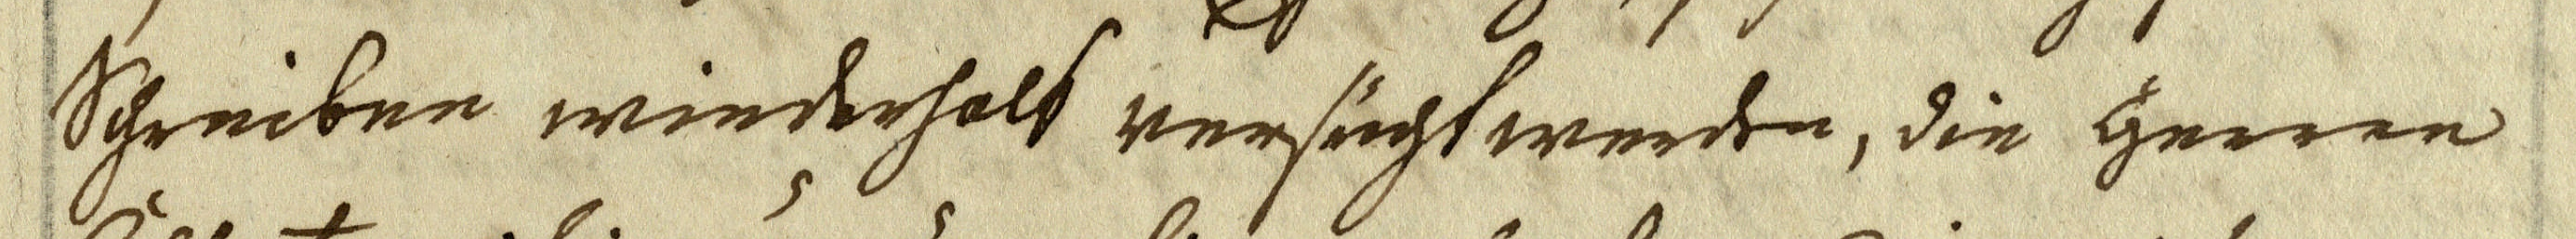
Schreiben wiederholt versucht werden, die Herren
